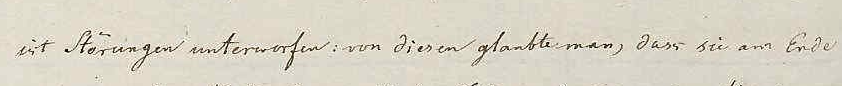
ist Störungen unterworfen: von diesen glaubte man, dass sie am Ende
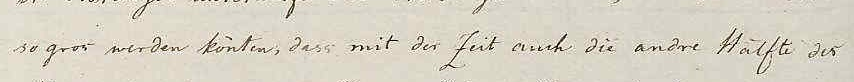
so gros werden könten, dass mit der Zeit auch die andre Hälfte des
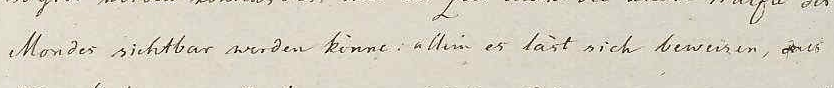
Mondes sichtbar werden könne: allein es läst sich beweisen, dass
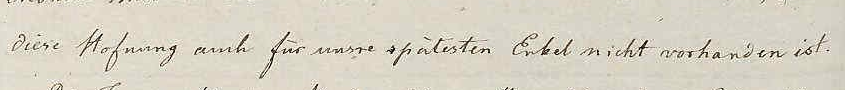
diese Hofnung auch für unsre spätesten Enkel nicht vorhanden ist.
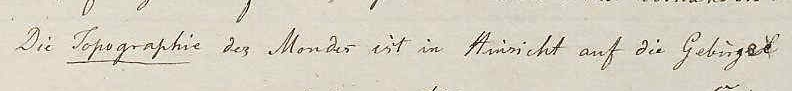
Die Topographie des Mondes ist in Hinsicht auf die Gebirgsle
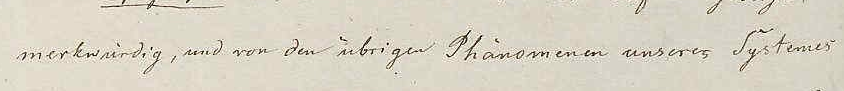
merkwürdig, und von den übrigen Phänomenen unseres Systemes
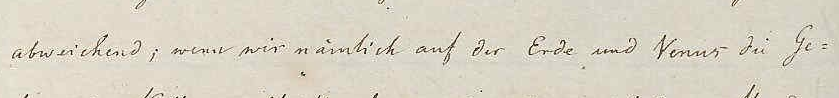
abweichend; wenn wir nämlich auf der Erde und Venus die Ge-
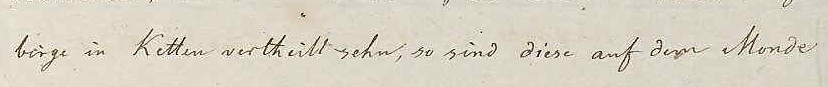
birge in Ketten vertheilt sehn, so sind diese auf dem Monde
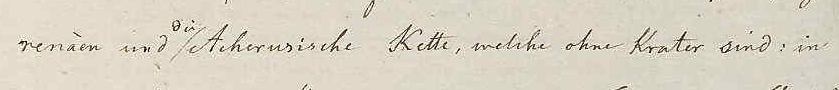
renäen und die Acherusische Kette, welche ohne Krater sind: in
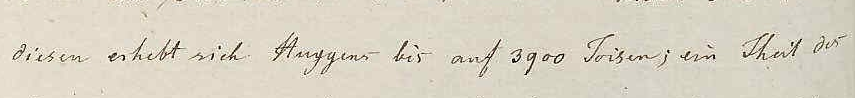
diesen erhebt sich Huygens bis auf 3900 Toisen; ein Theil des
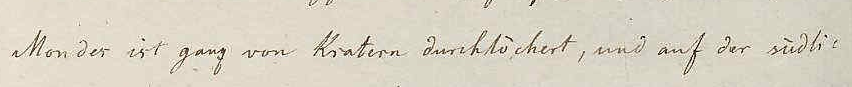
Mondes ist ganz von Kratern durchlöchert, und auf der südli-
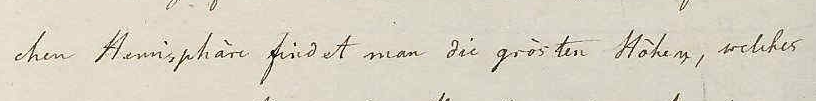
chen Hemisphäre findet man die grösten Höhe,n, welches
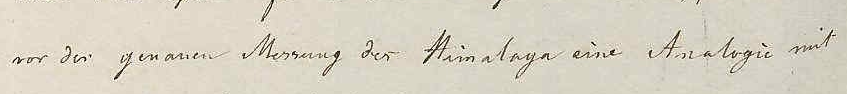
vor der genauen Messung des Himalaya eine Analogie mit
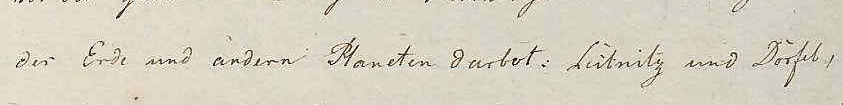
der Erde und andern Planeten darbot: Leitnitz und Dörfel,
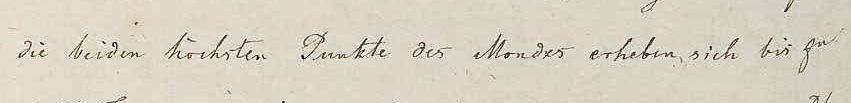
die beiden höchsten Punkte des Mondes erheben sich bis zu
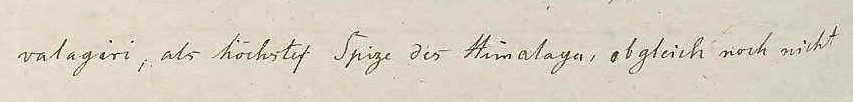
valagiri, als höchster Spize des Himalaya, obgleich noch nicht
